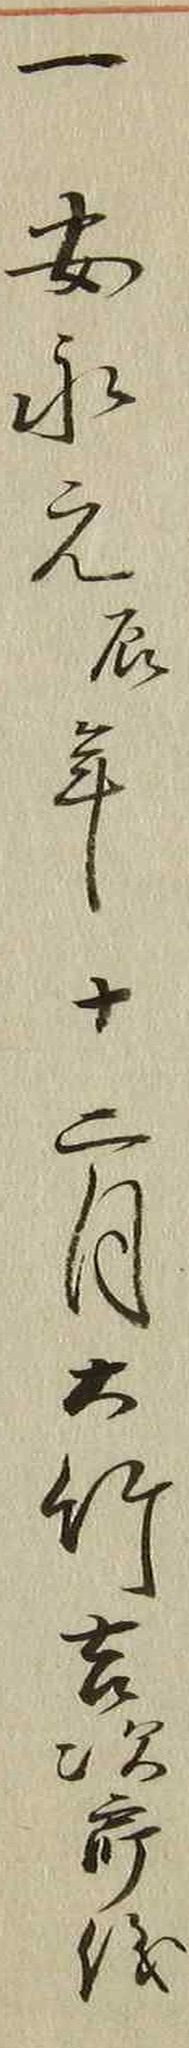一安永元辰年十二月大竹吉次郎儀
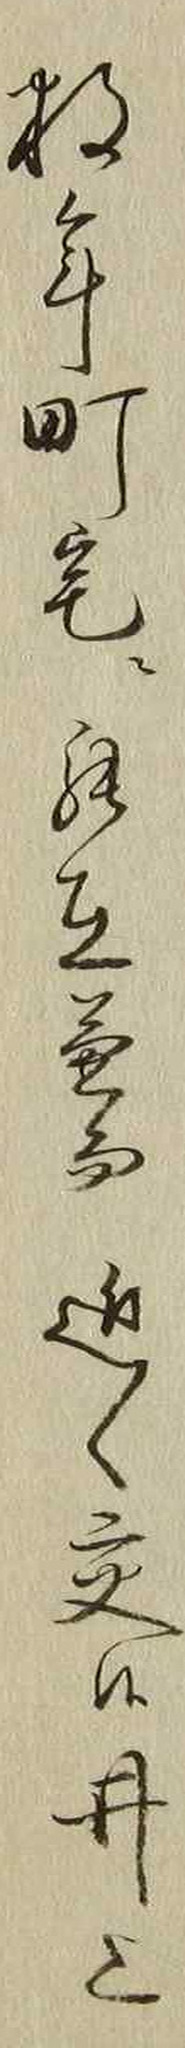数年町宅罷在兼而近く交候井上
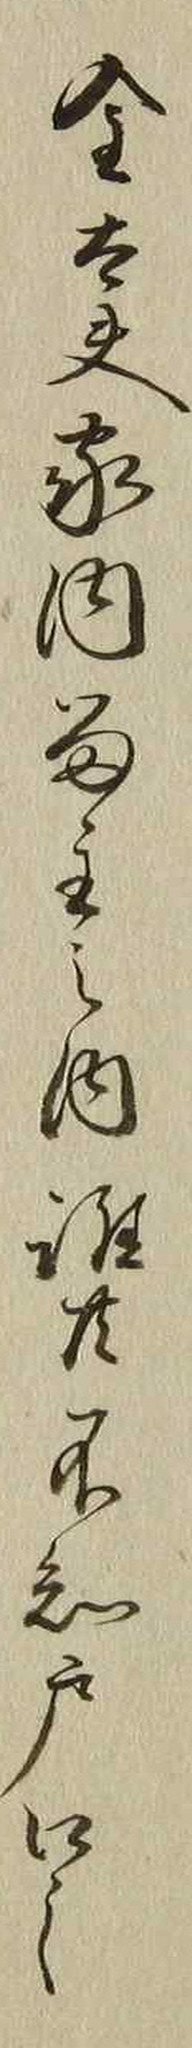金太夫家内留主之内誰共不知戸口之
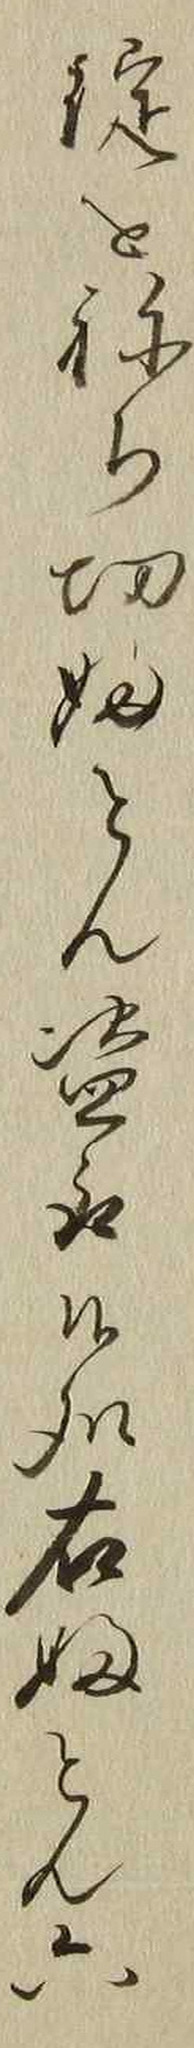錠をねち切ふとん盗取候処右ふとん六
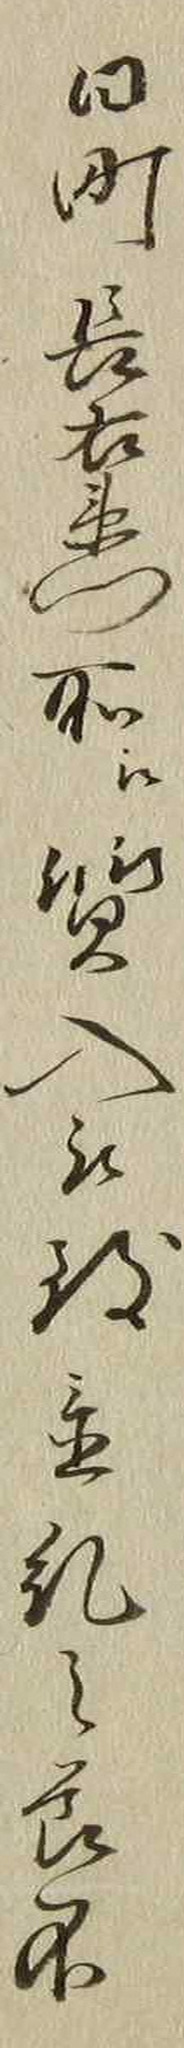日町長右衛門所江質入被致置糺之節不
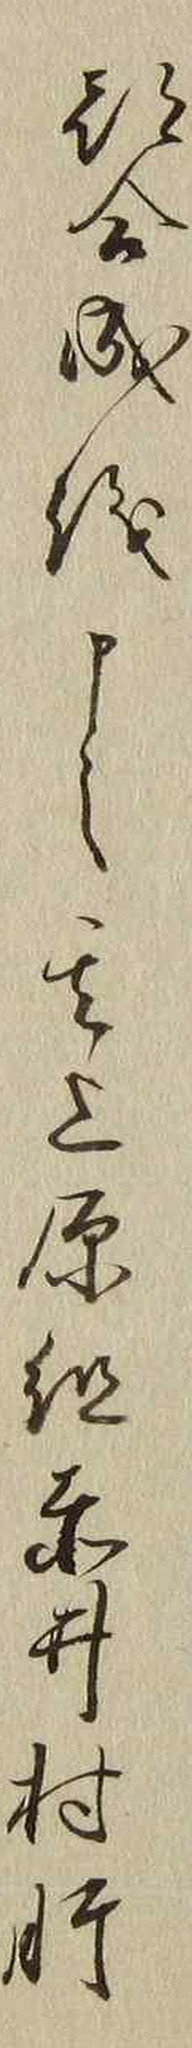都合成儀申候其上原組赤井村肝
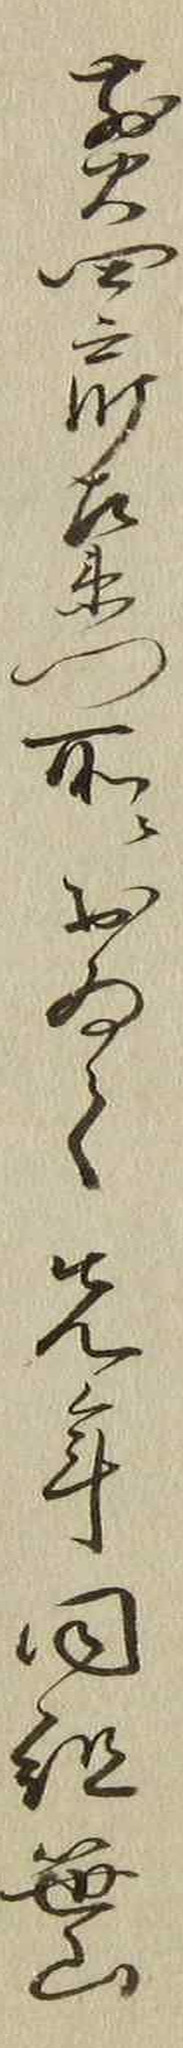煎四郎左衛門所ニおいて先年同組笹山
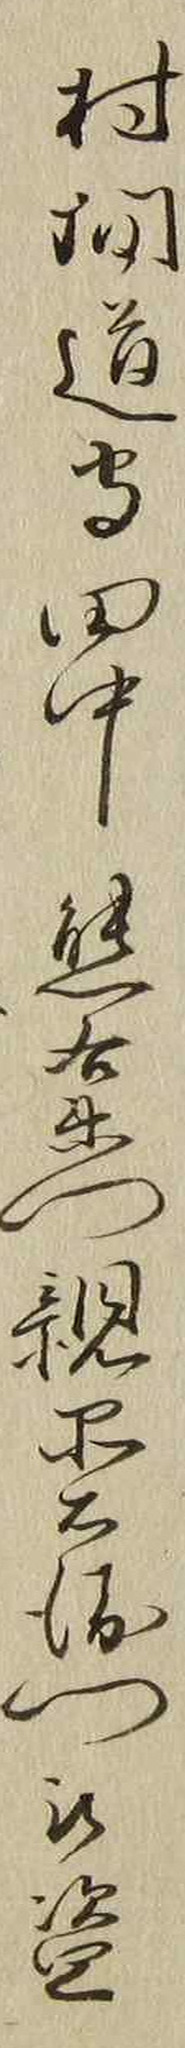村間道守田中熊右衛門親品右衛門被盗
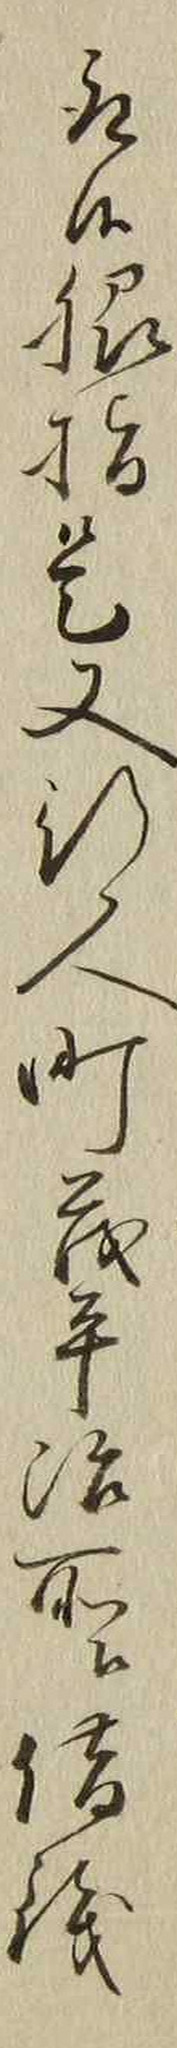取候脇指是又行人町茂平治所江借銭
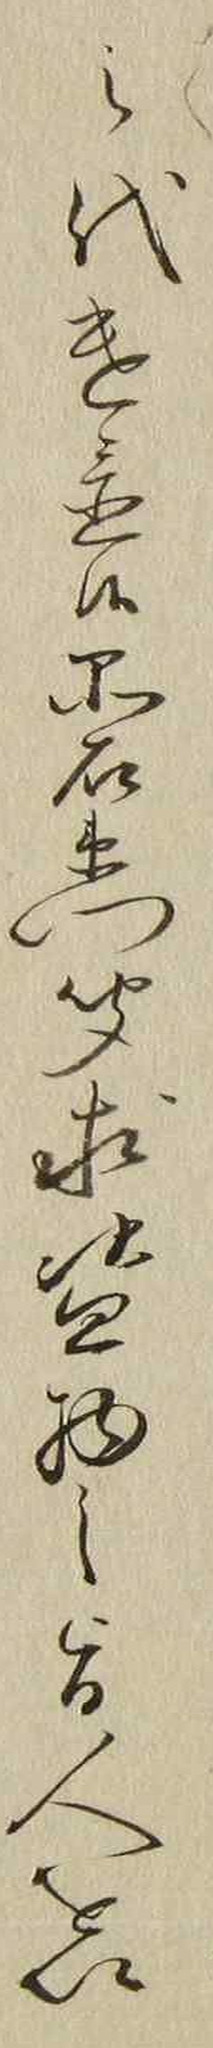之代遣置候品右衛門聞求盗物之旨人を以
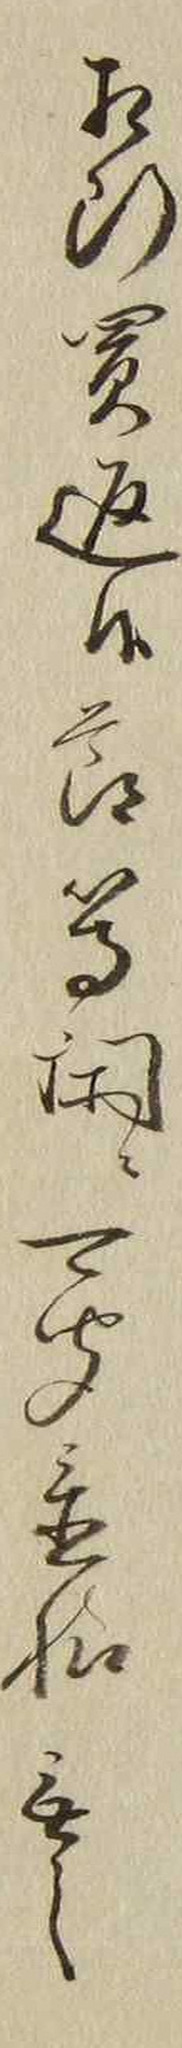相断買返候節等閑ニ可聞置様無之
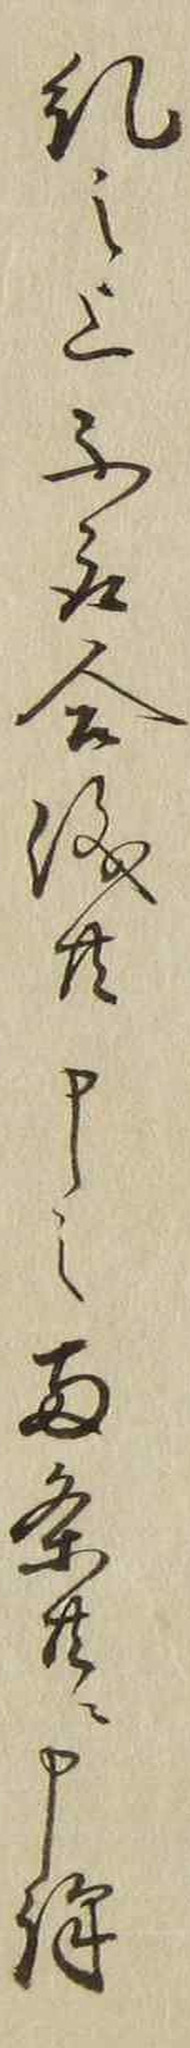糺之上不取合儀共申之両条共ニ申訳

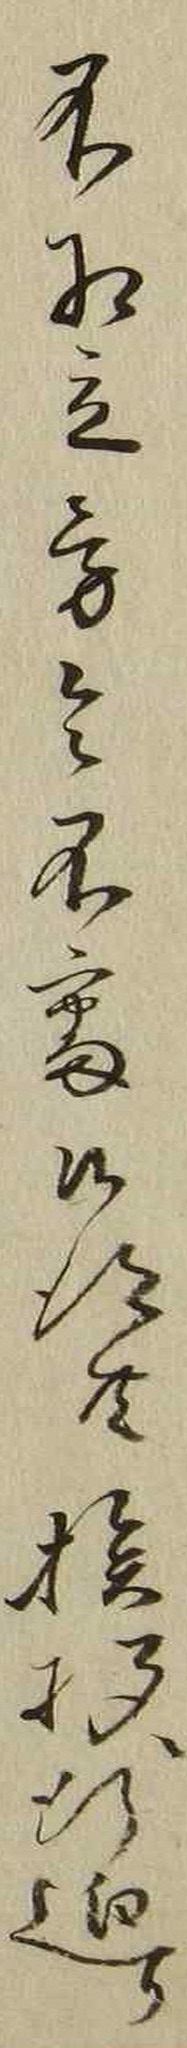不相立方令不審候得共挨拶ヘ行廻り
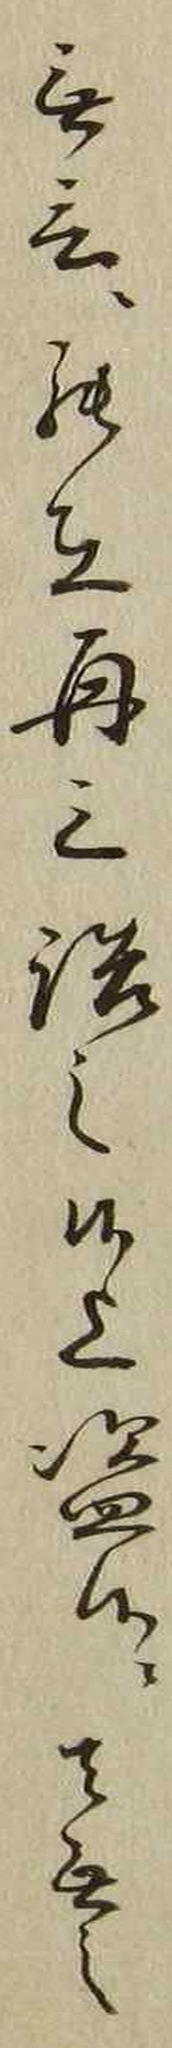無言ニ罷在再三詰之候上盗候ニ者無之
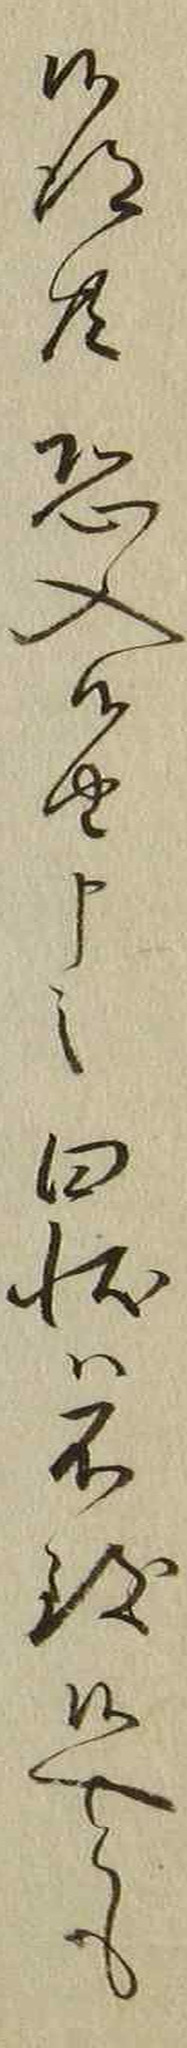候得共恐入候由申之白状ハ不致候へとも
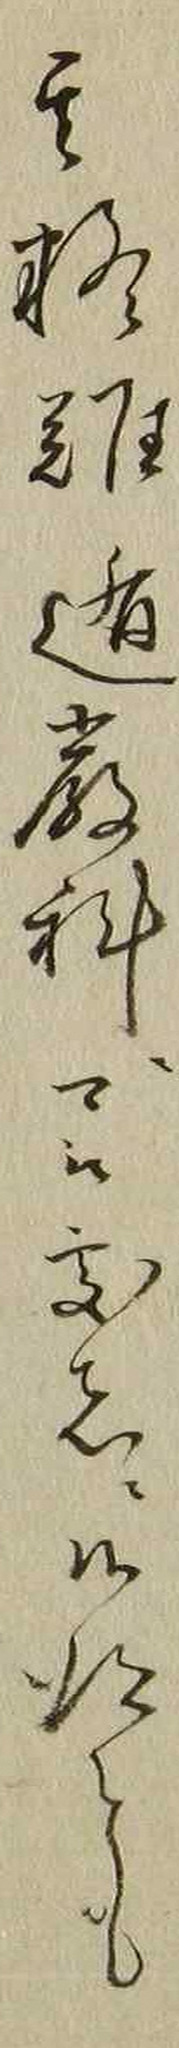其疑難遁厳科ヘ可被處者ニ候得とも
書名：諸士系譜　巻之68　を之部2
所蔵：会津若松市立会津図書館
